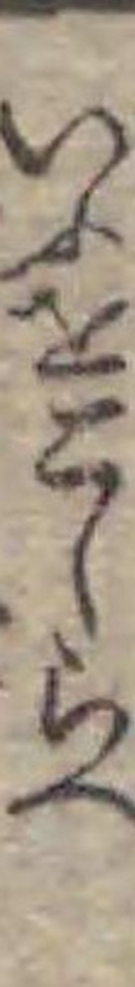いふをこしらへて
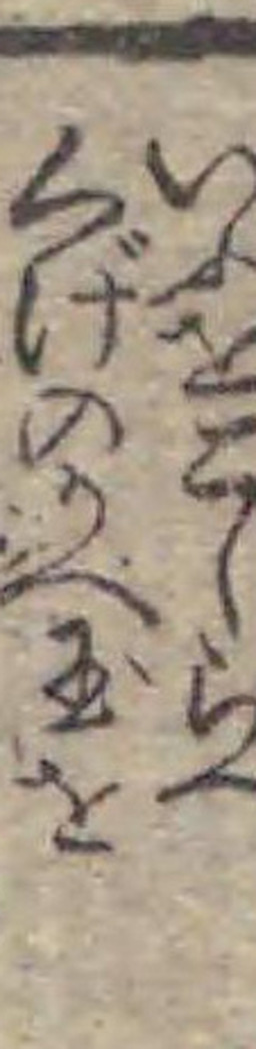くげのかへ玉を
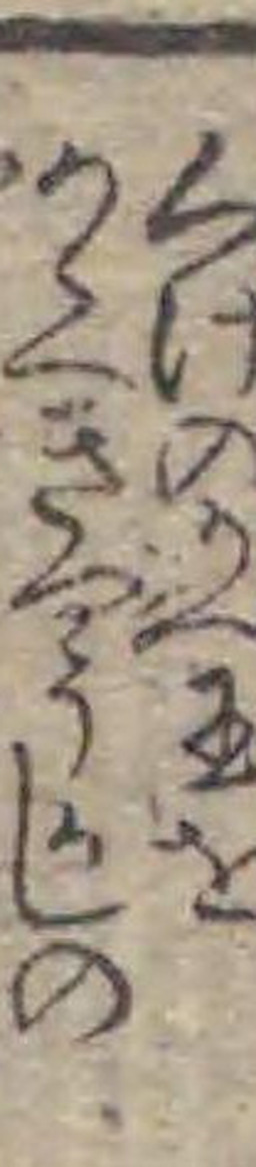かゝへきやうかしの
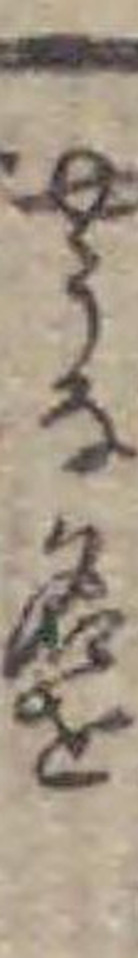やうな名を
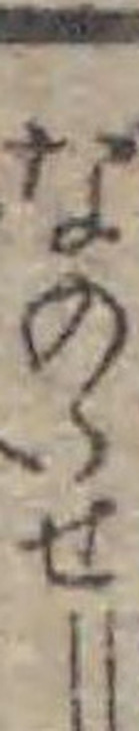なのらせ
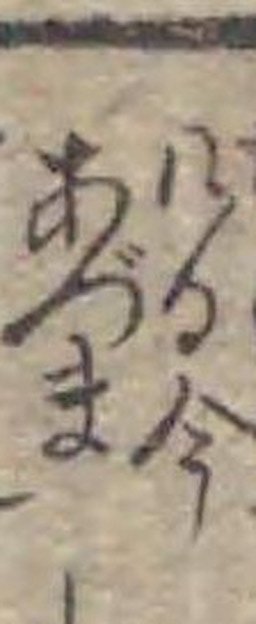あづま
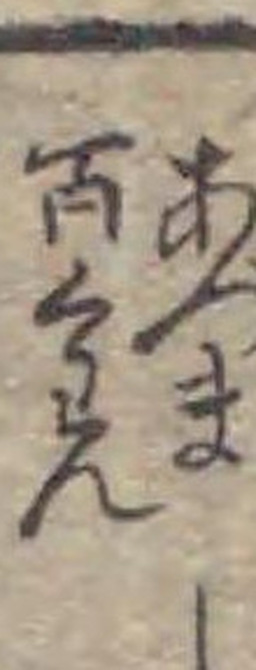百くわん
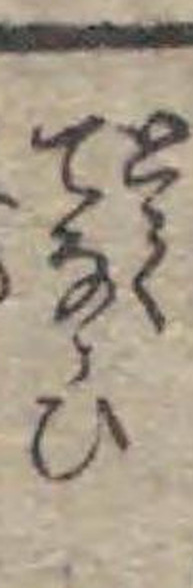てならひ
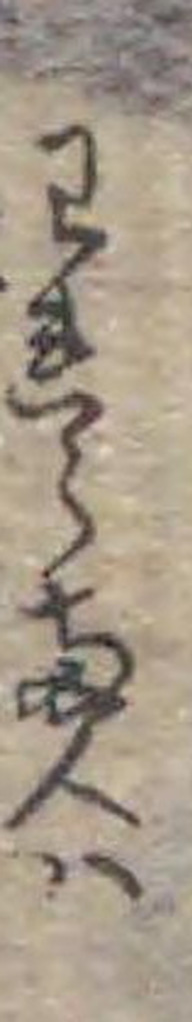われら両人は
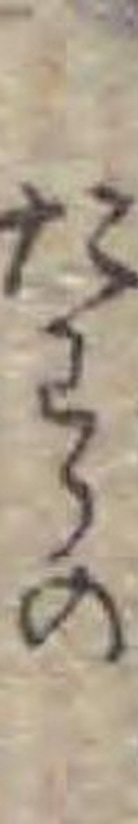たわらの
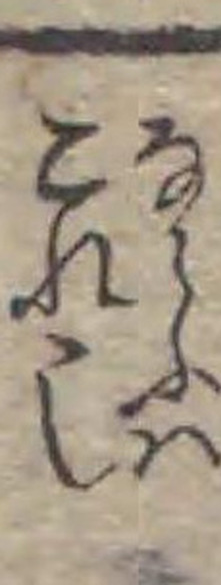これ也
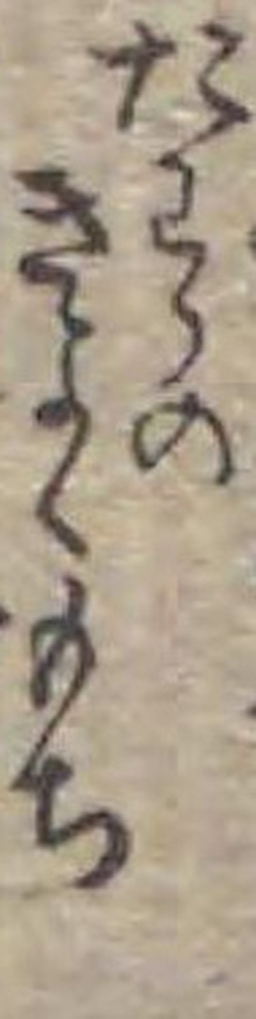きよくもち
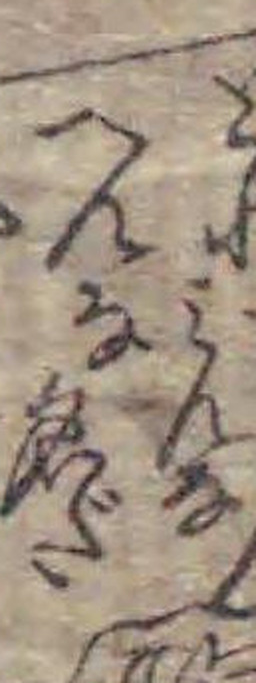へんな名だ
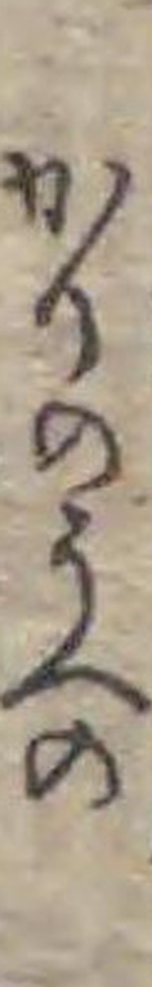かりのうへの
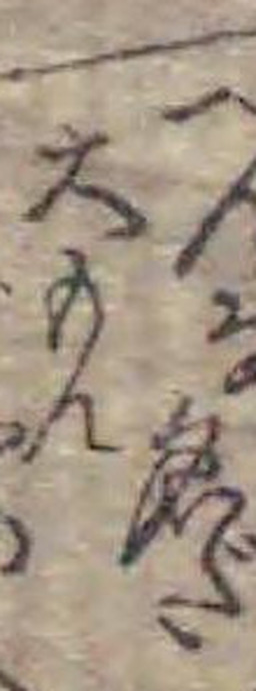大もん
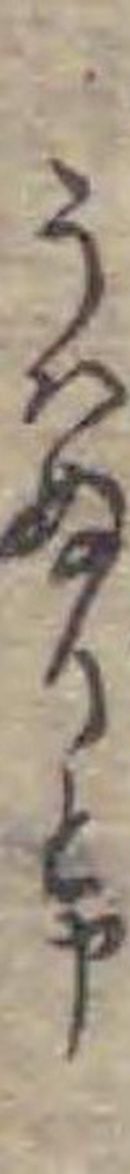うはぬりと申
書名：時代世話二挺皷 : 2巻
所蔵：国立国会図書館 National Diet Library, JAPAN
